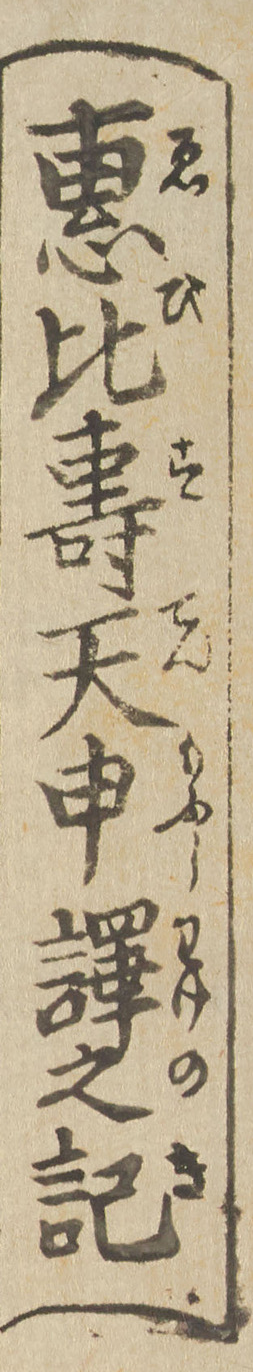恵比寿天申訳之記
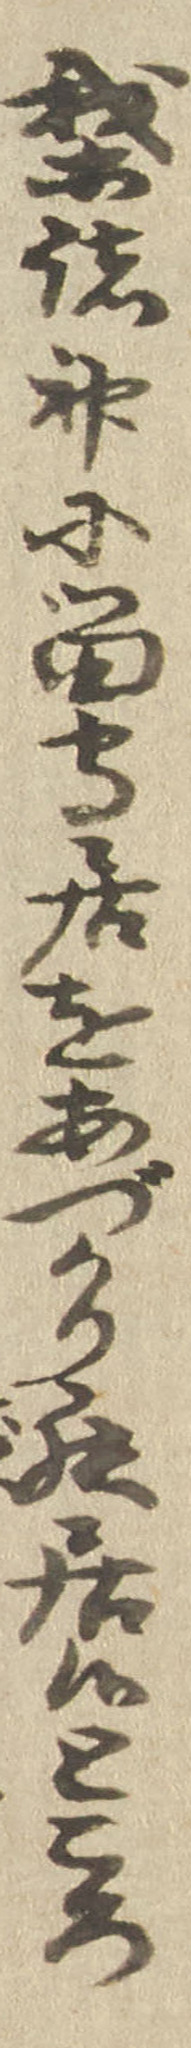我等諸神に留守居をあづかり罷居候ところ
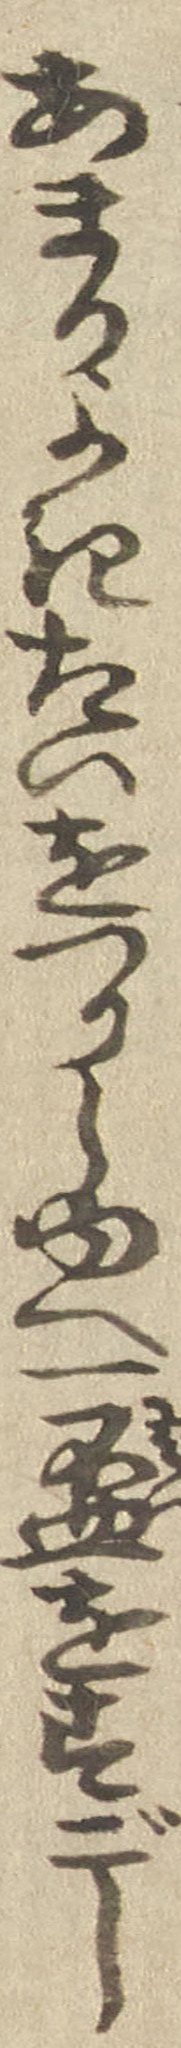あまりよきたいをつりしゆへ一盃をすごし
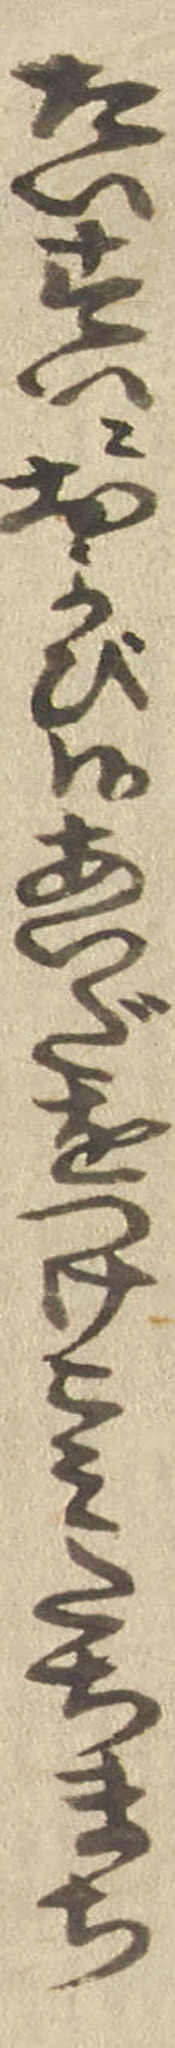たいすいニおよび候あいだをつけこみたちまち
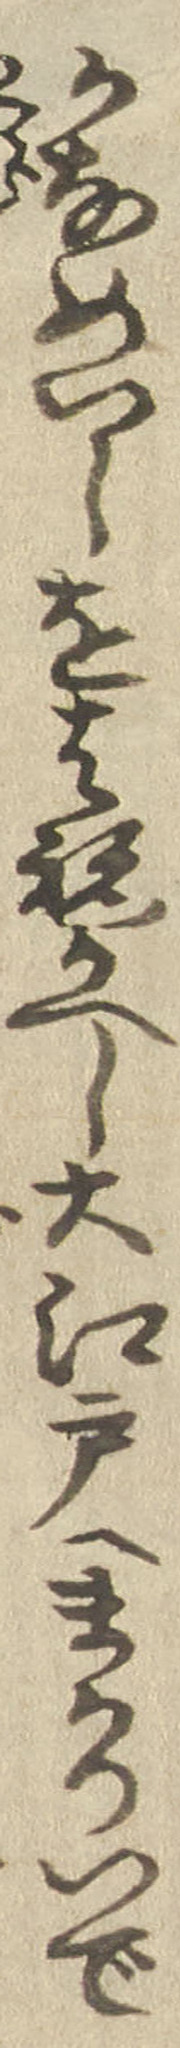かなめいしをはねかへし大江戸へまかりいで
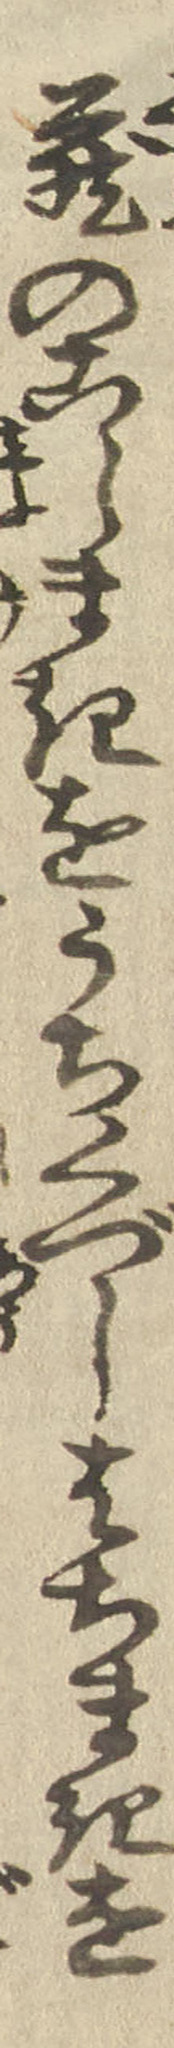蔵のこしまきをうちくづしはちまきを
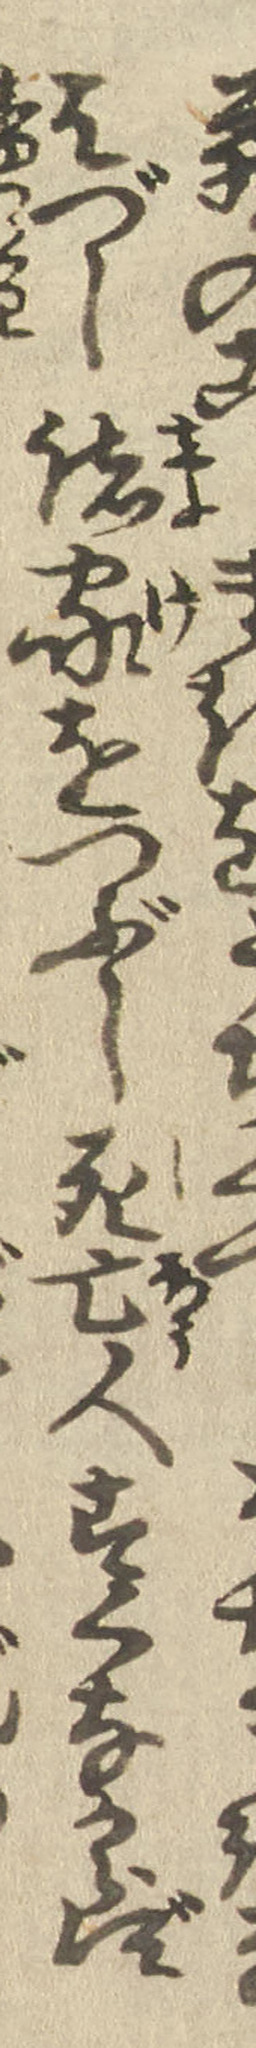はづし諸家をつぶし死亡人すくなからず
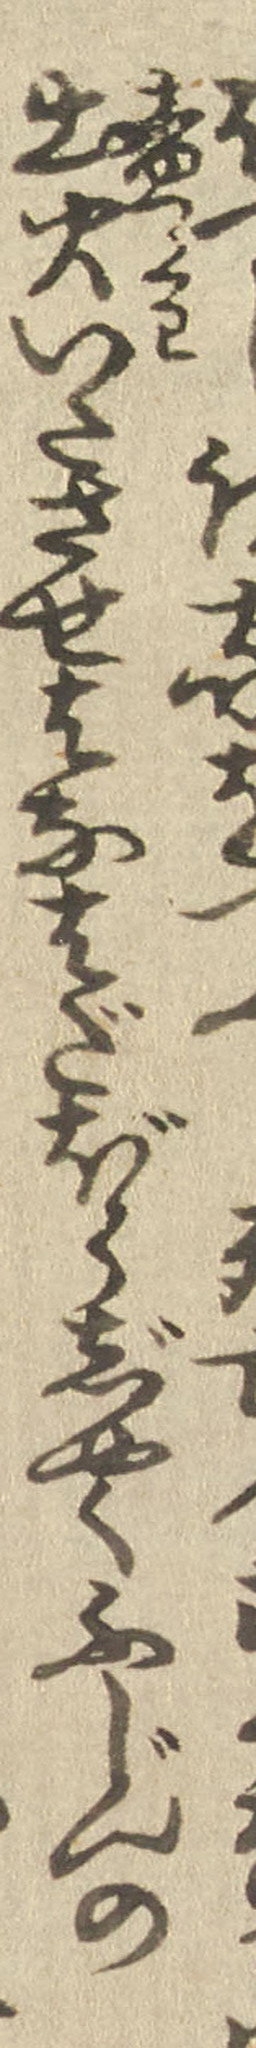出火いたさせはなはだぼうじやくふじんの
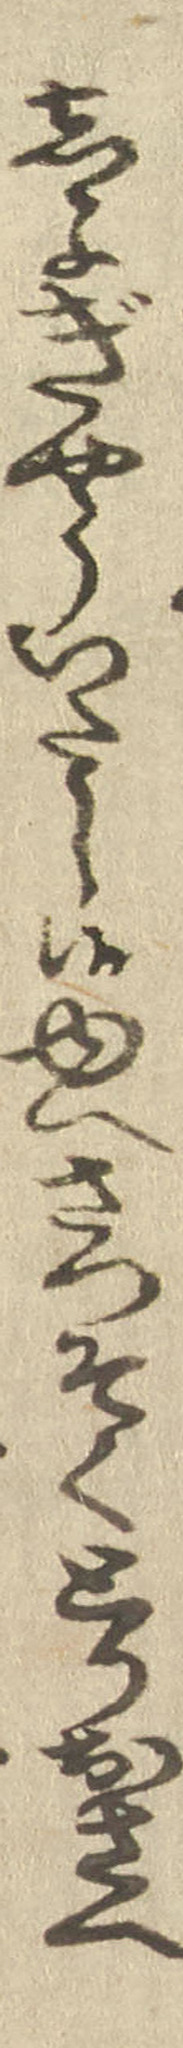しよぎやういたし候ゆへさつそくとりおさへ
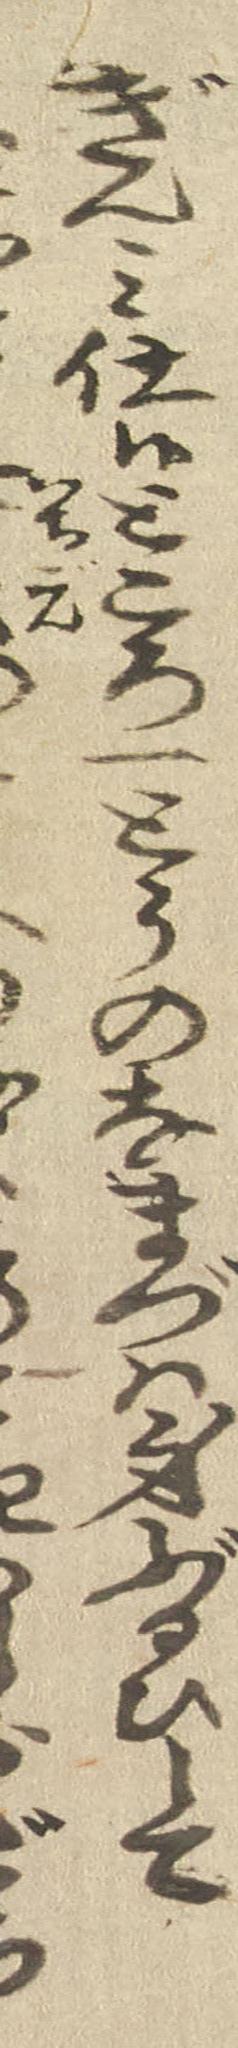ぎんみ仕候ところ一とうのなまづは身ぶるひして
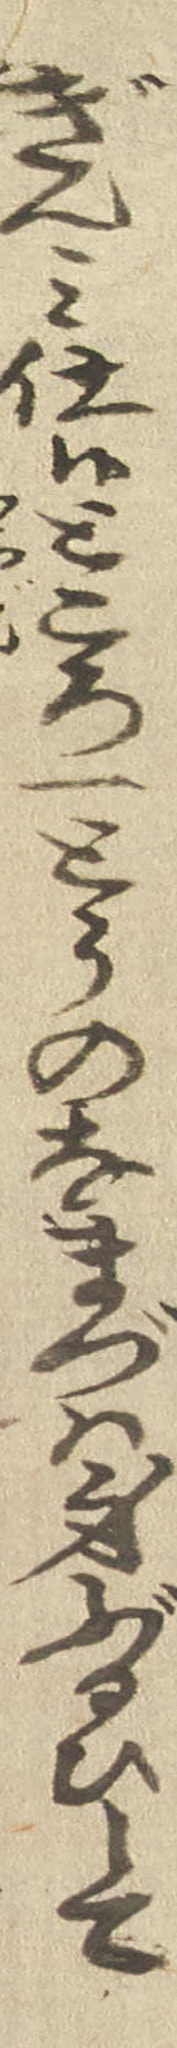ぎんみ仕候ところ一とうのなまづは身ぶるひして
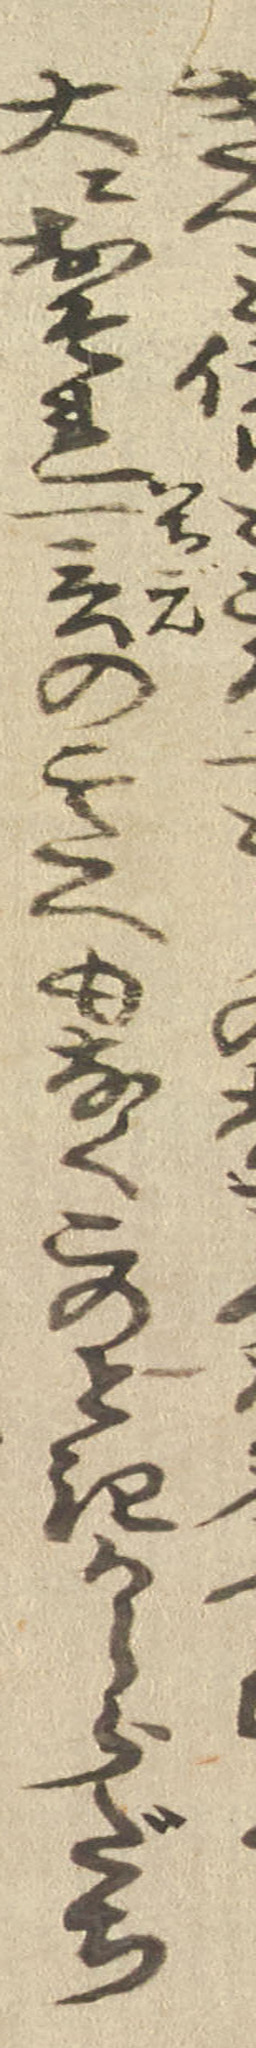大ニおそれ一言のこたへもなくこのときかしらだち
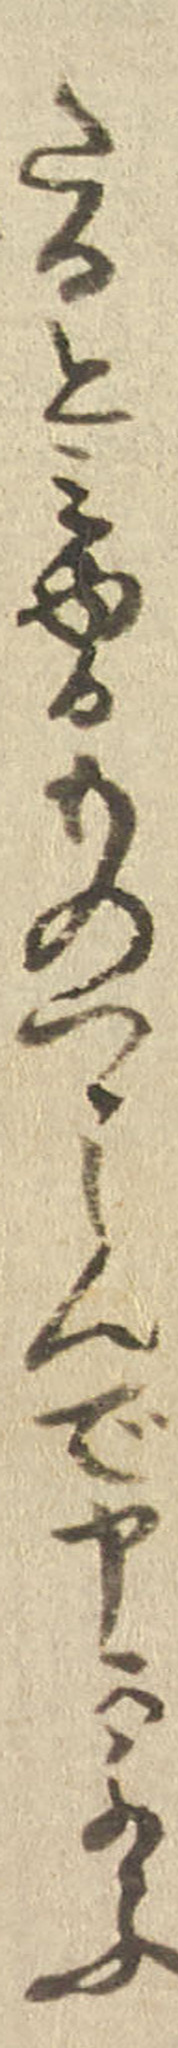たるとみゆるものつゝしんで申スよふ
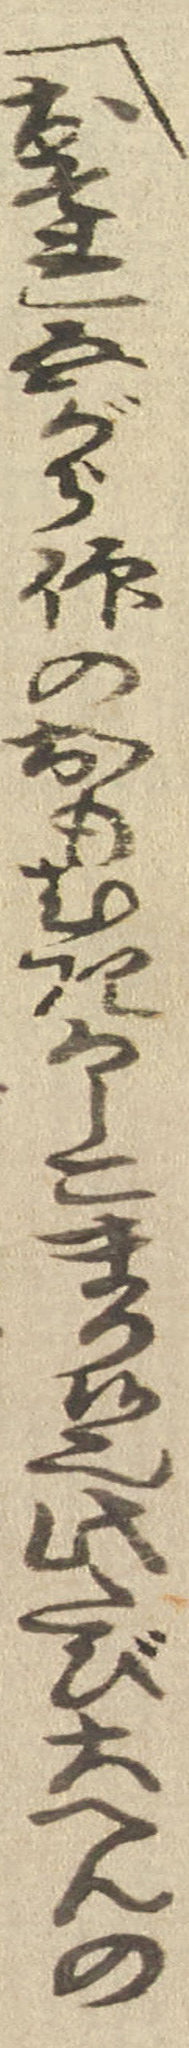「おそれながら仰のおもむきかしこまり候也此たび大へんの
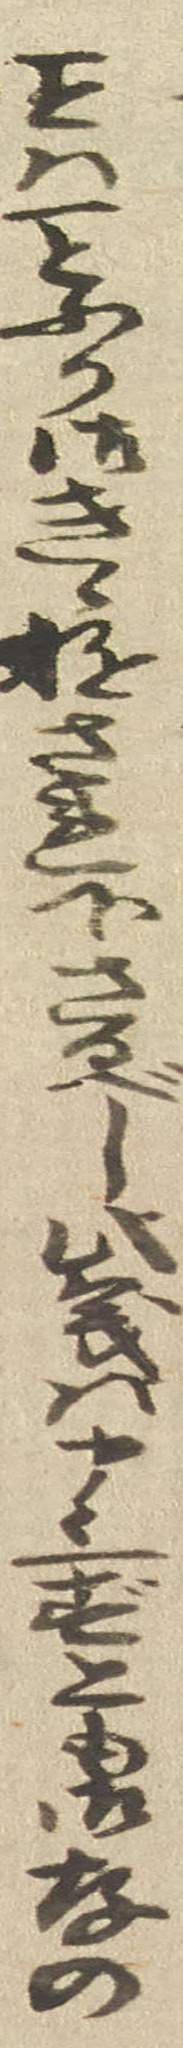ことは一とふり御きゝ遊され下さるべし此義は申上ずとも御存の
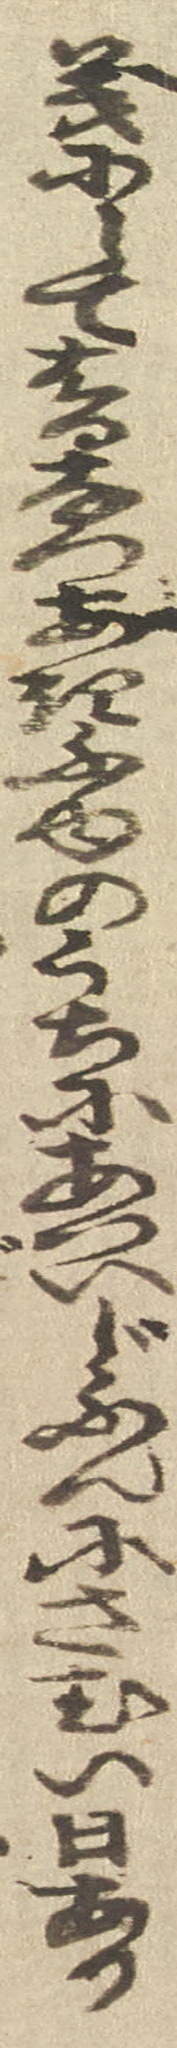義にしてはるなつあきふゆのうちにあついじふんにさむい日あり
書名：恵比寿天申訳之記
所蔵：東京大学総合図書館 General Library in the University of Tokyo, JAPAN
